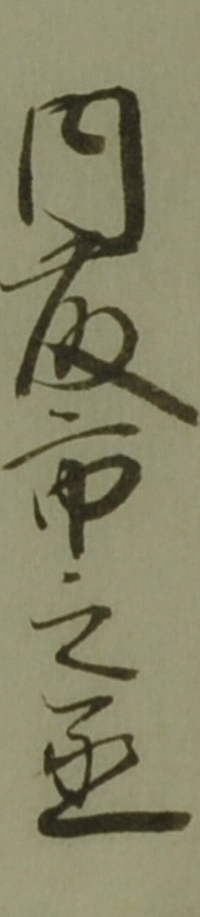内藤市之丞
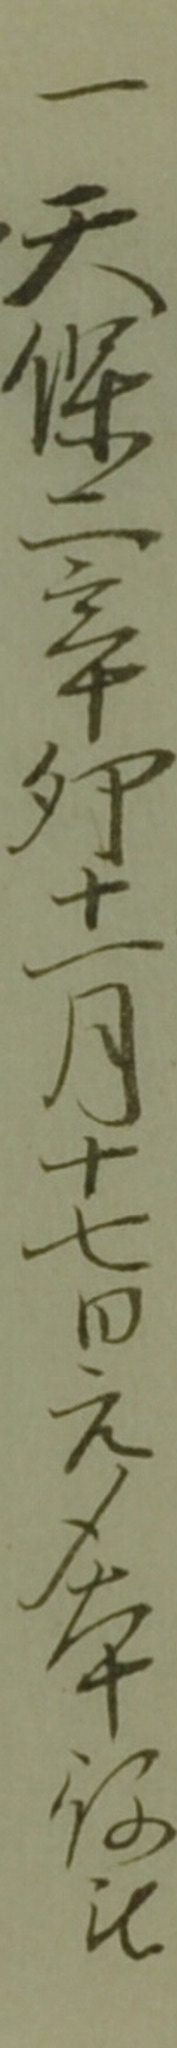一天保二辛卯十一月十七日元〆本役被
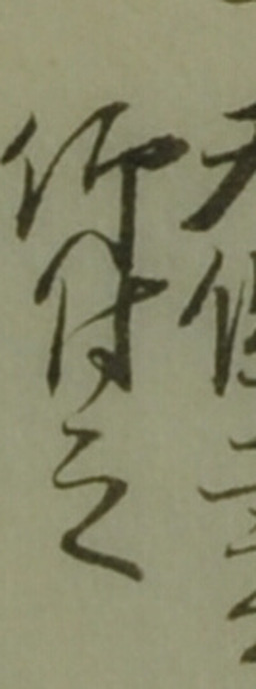仰付之

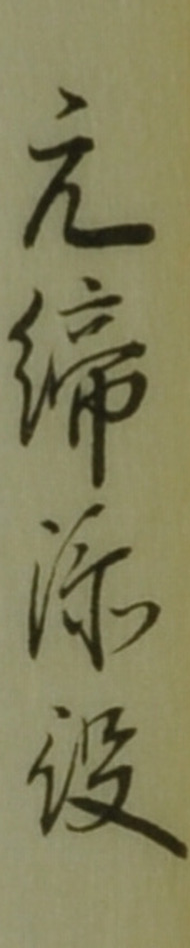元締添役
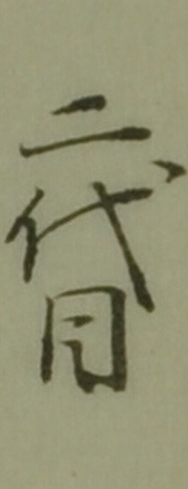二代目
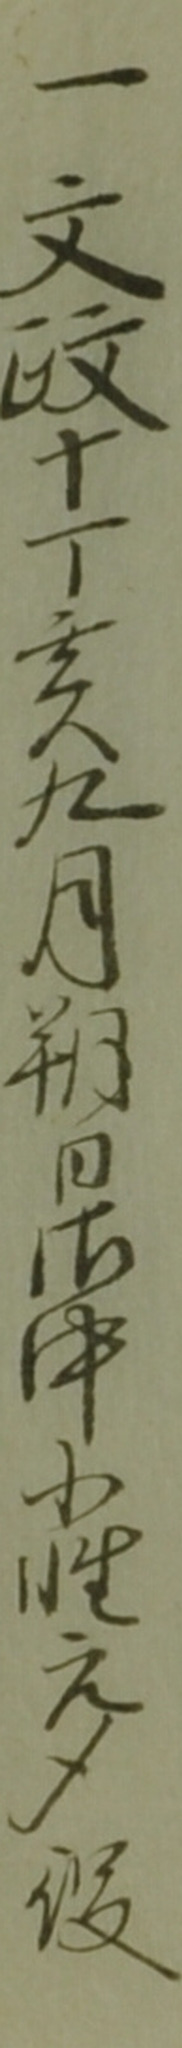一文政十丁亥九月朔日御中小性元〆役
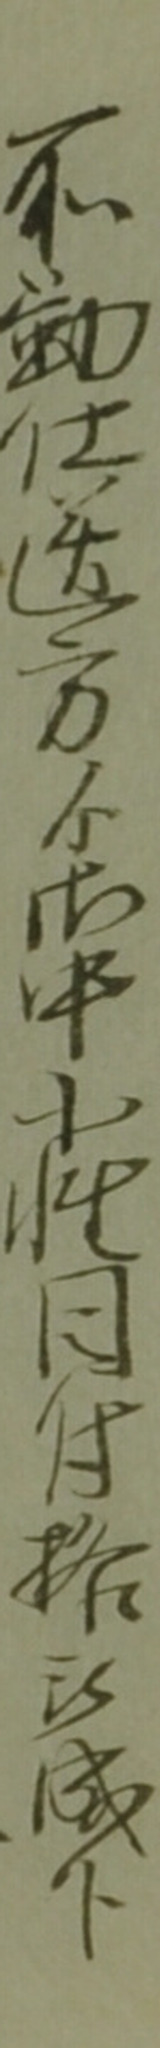所勤仕送方ゟ御中小性目付格被成下
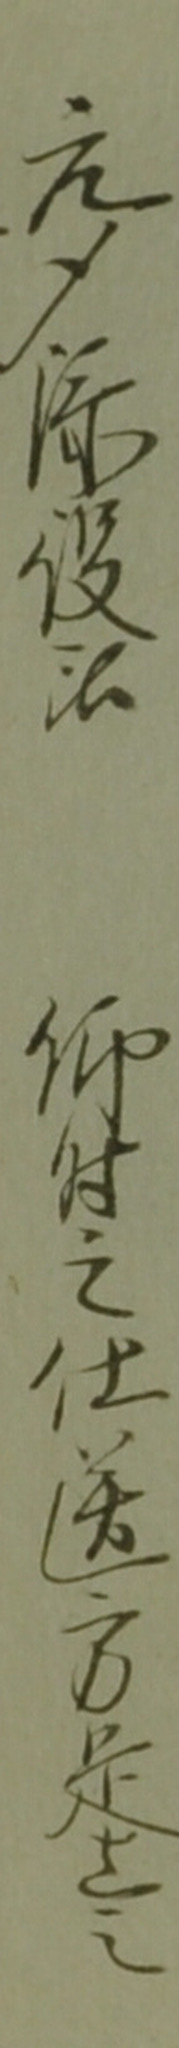元〆添役被仰付之仕送方是迄之
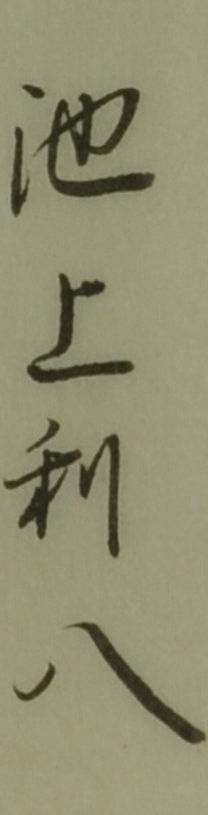池上利八
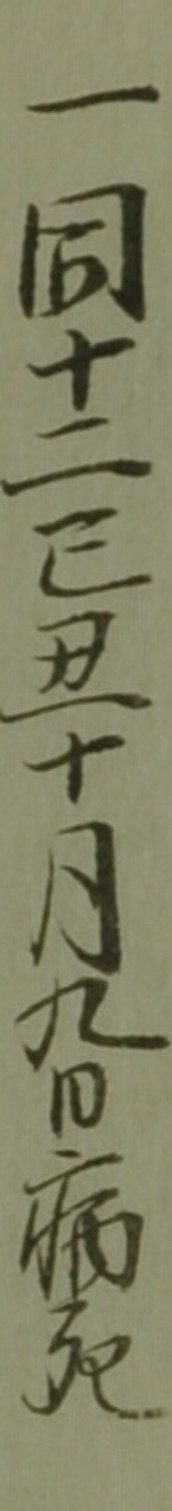一同十二己丑十月九日病死
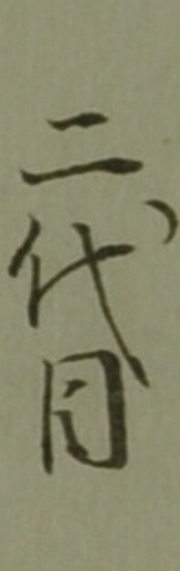二代目
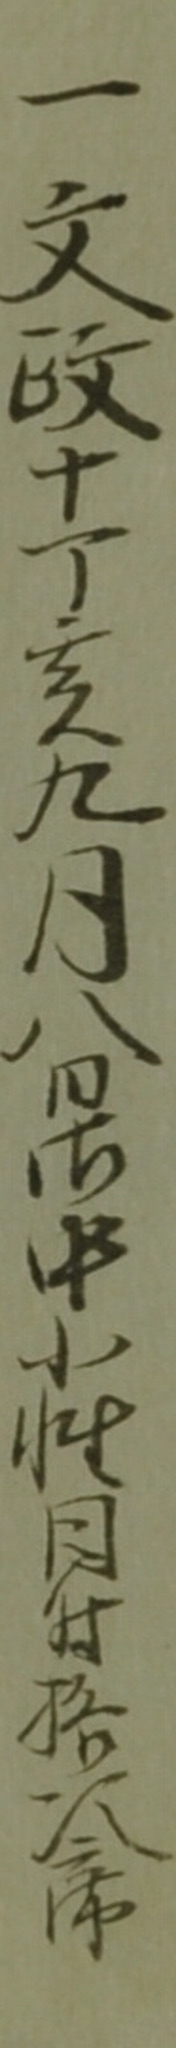一文政十丁亥九月八日御中小性目付格次席
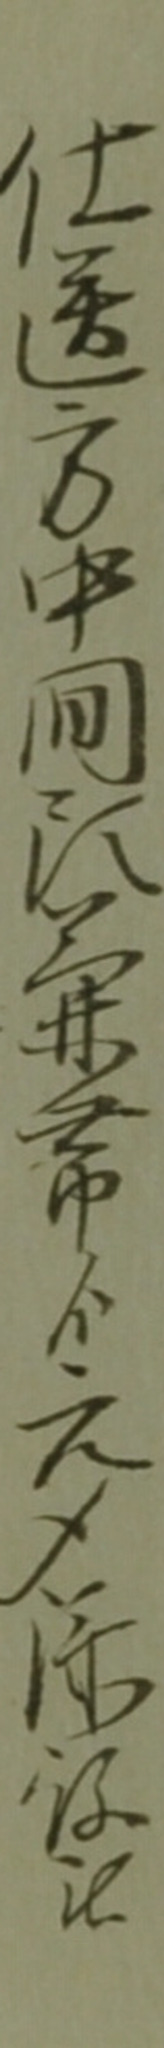仕送方中間頭兼帯ゟ元〆添役被
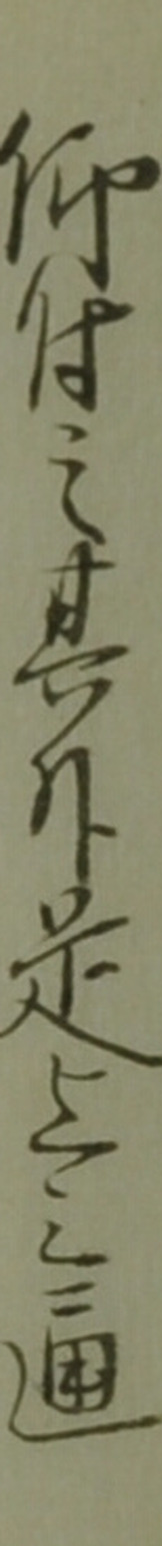仰付之其外是迄之通
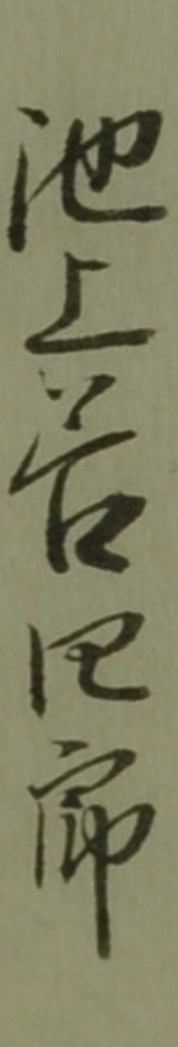池上善四郎
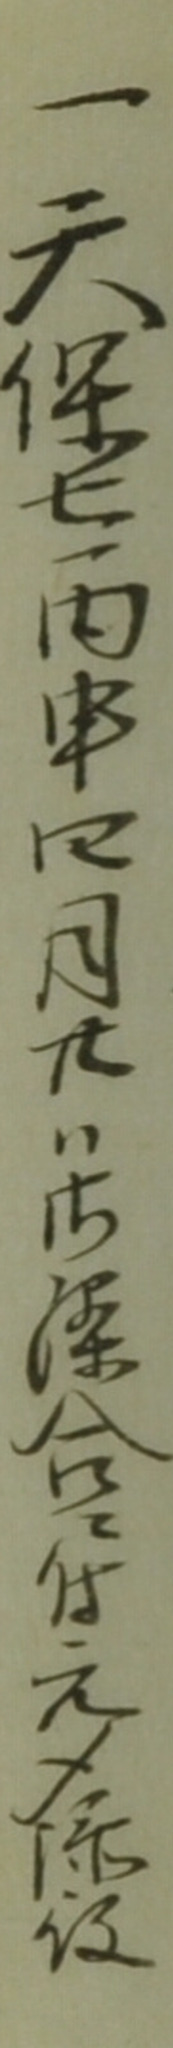一天保七丙申四月廿日御繰合付元〆添役
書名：諸御役代々録（七）
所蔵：伊那市立高遠町図書館・合同会社AMANE
